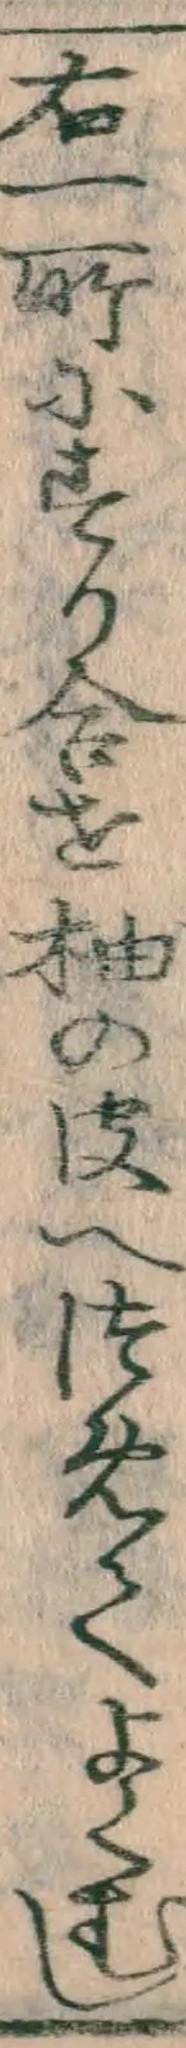右一所にすり合せ柚の皮へつめてよくむし
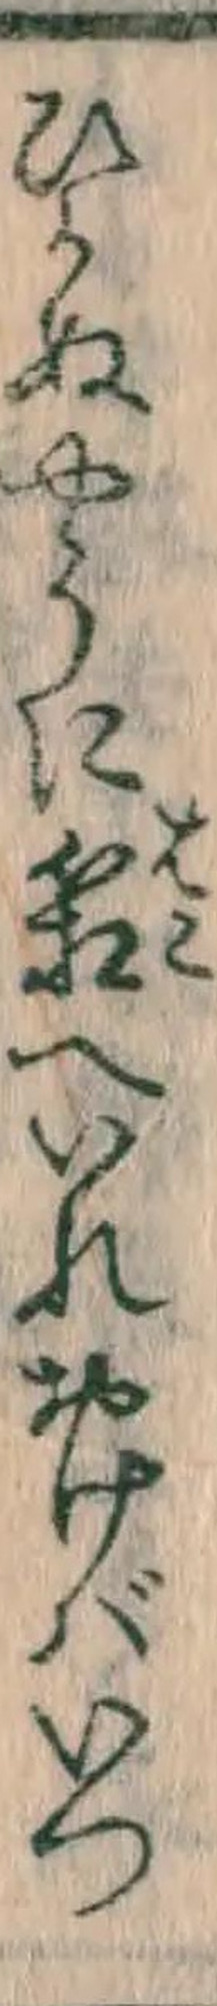ひかぬやうに箱へいれおけばいつ
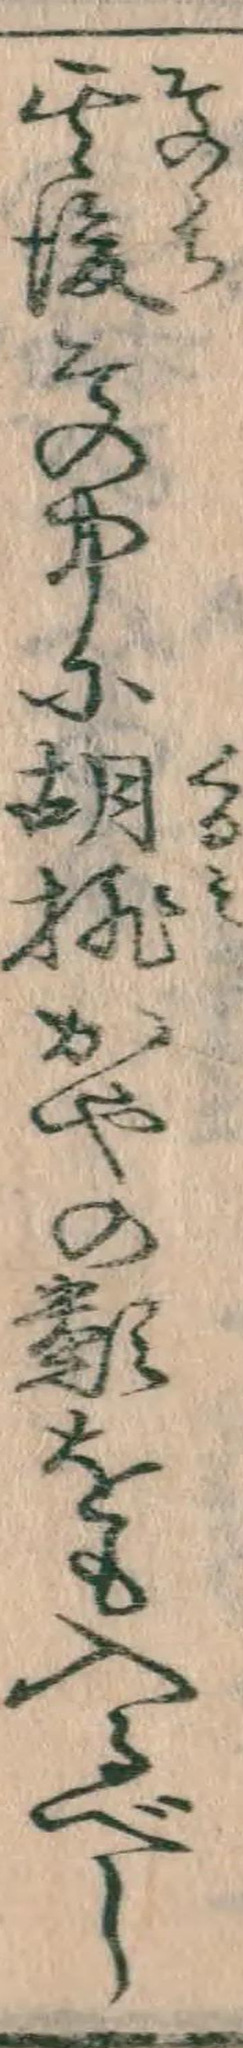其後その中に胡桃かやの類をも入るべし
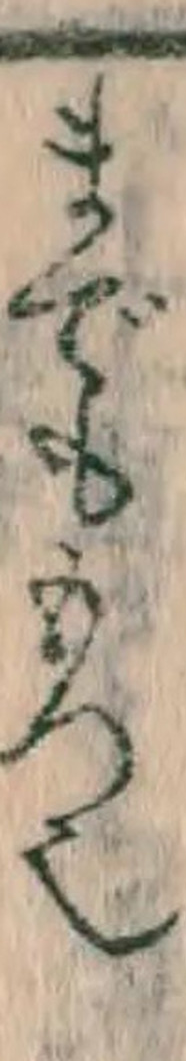までももつ也
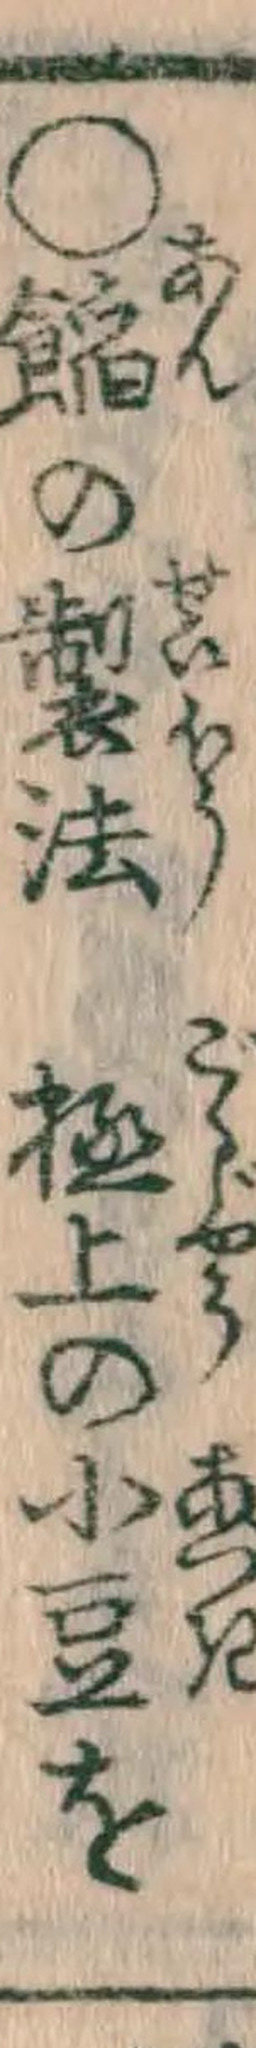○餡の製法極上の小豆を
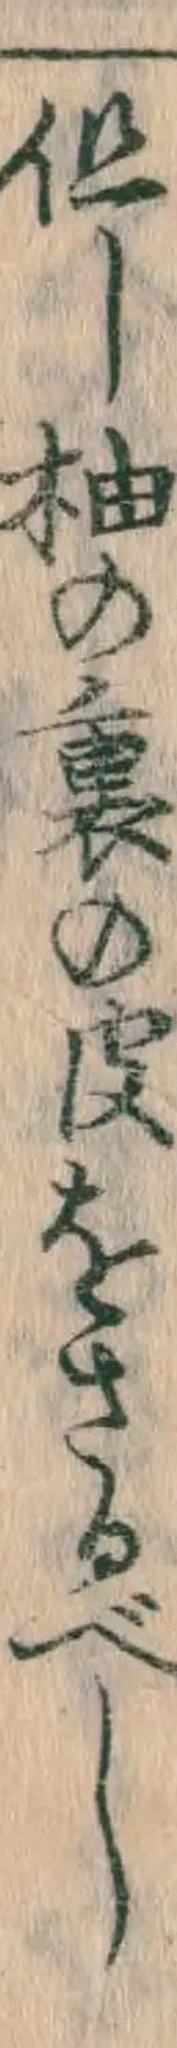但し柚の裏の皮をさるべし
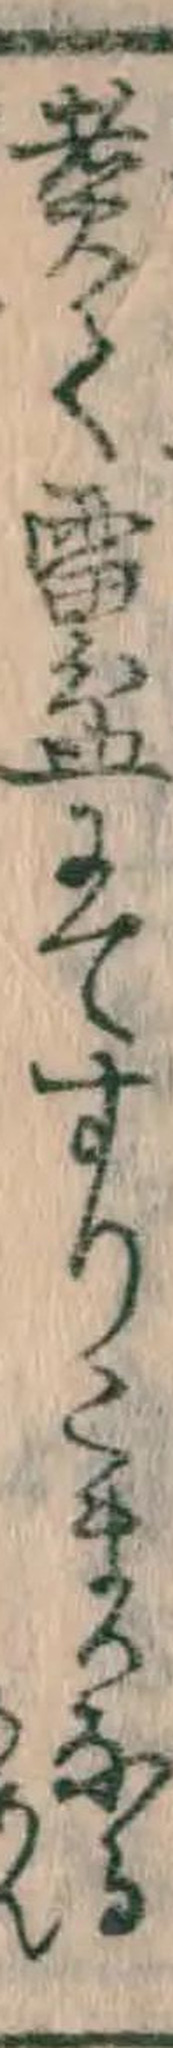煮て雷盆にてすりこまかなる
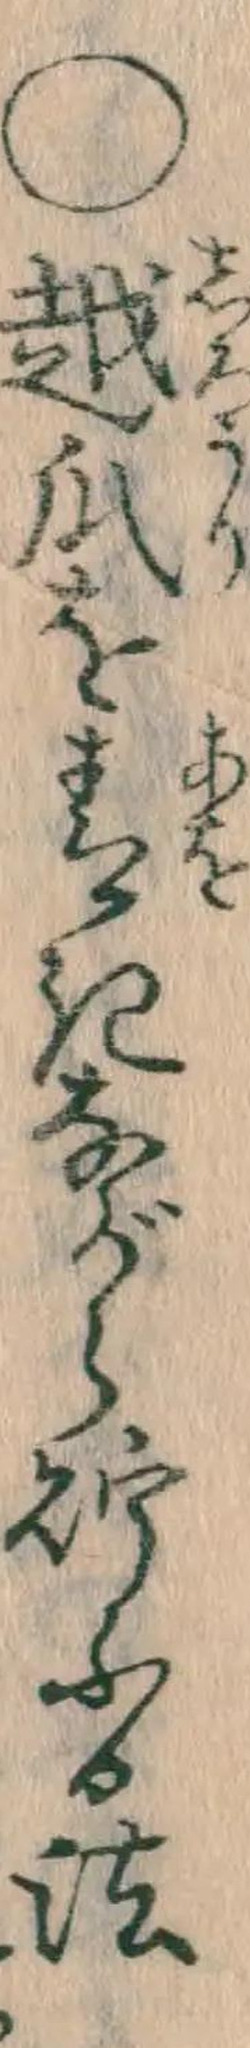○越瓜を青きながら貯ふる法
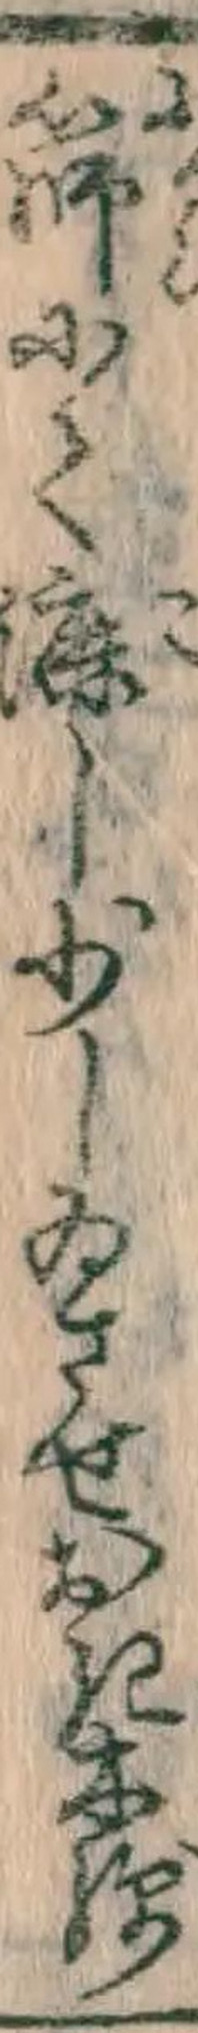篩にて漉し少しゐさせおき木綿
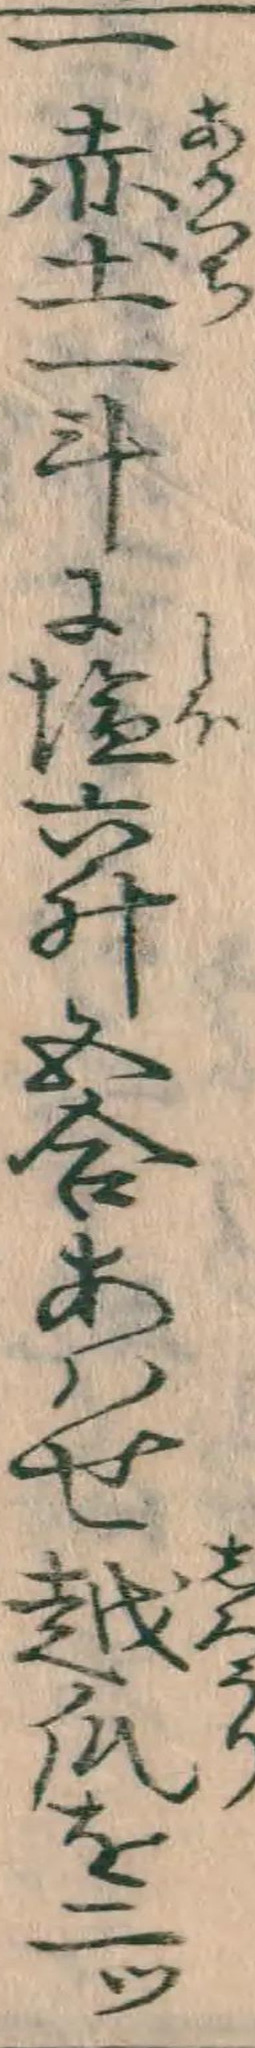一赤土一斗に塩六升五合あはせ越瓜を二ッ
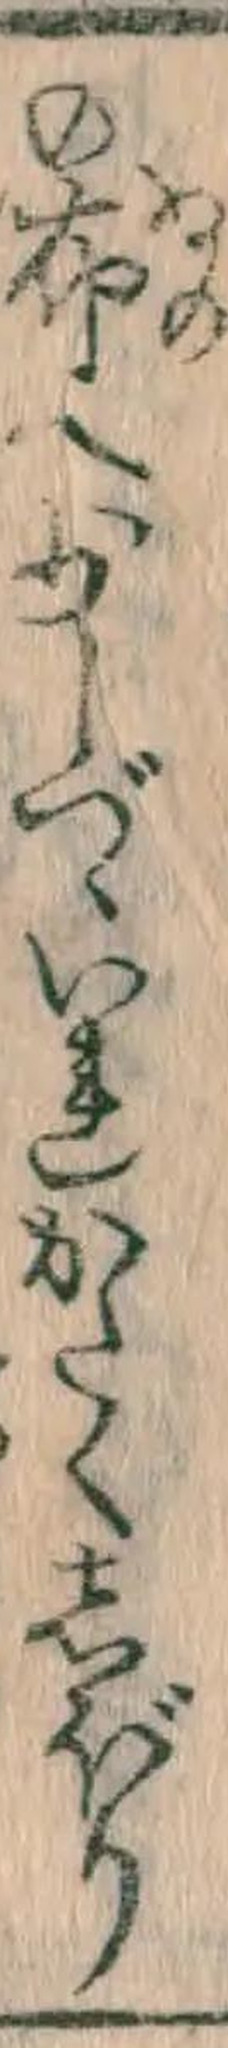の布へ少しづゝいれかたくしぼり
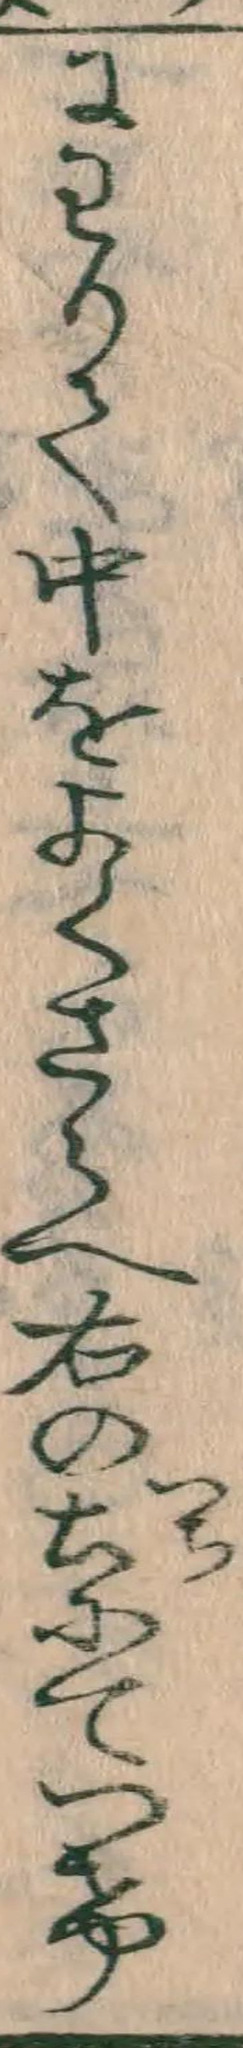にわりて中をよくさらへ右の土にてつけ
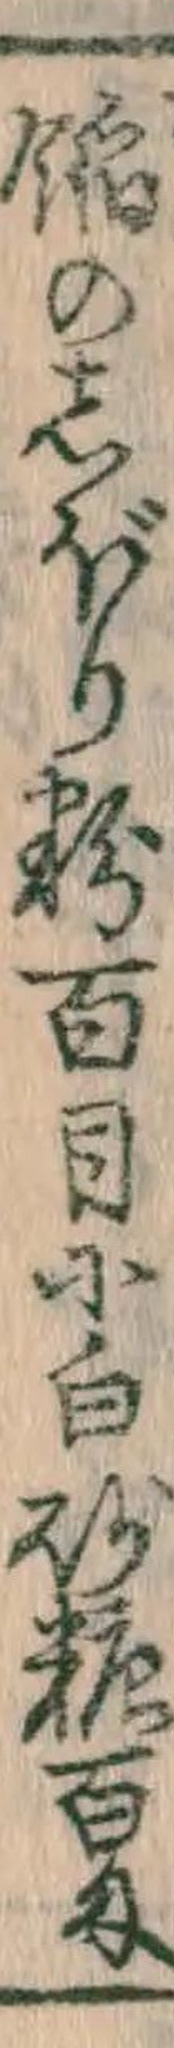餡のしぼり粉百目に白砂糖百匁
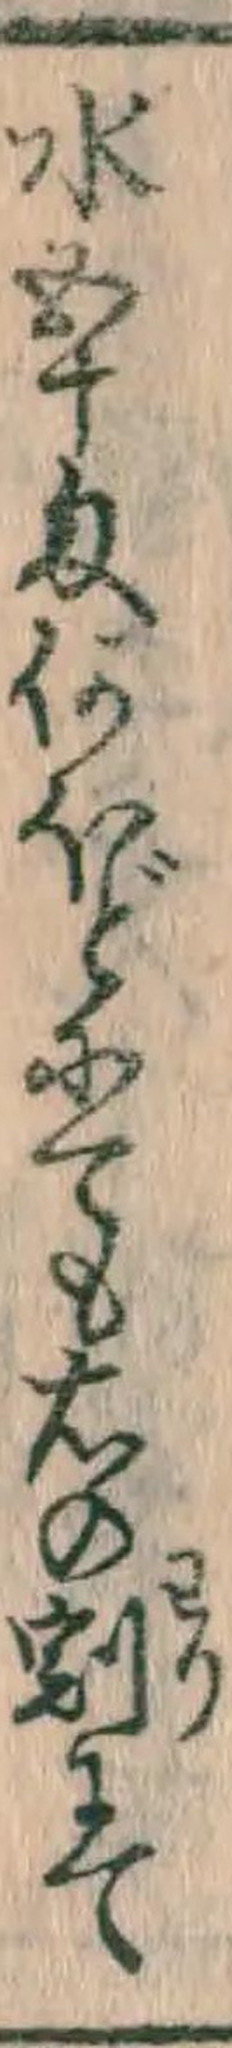水五十匁何ほどにても右の割にて
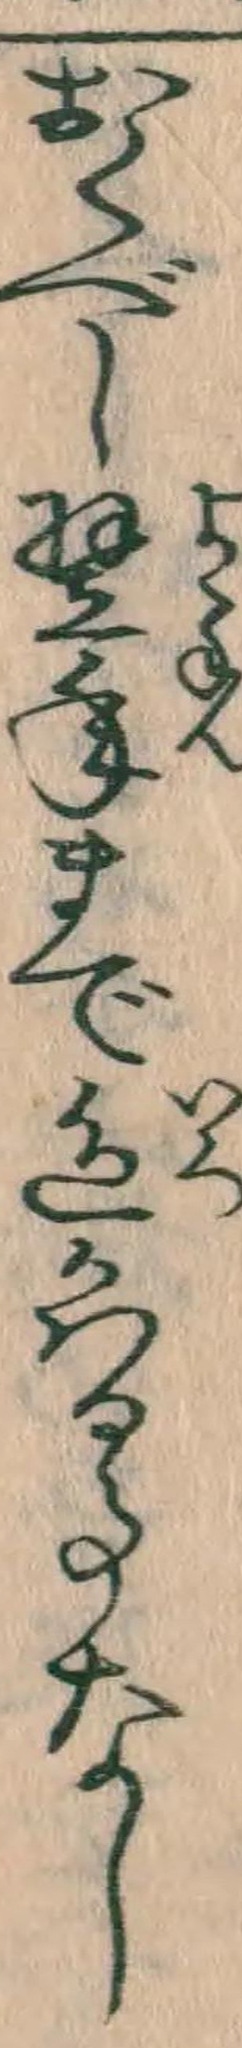おくべし翌年まで色かはる事なし
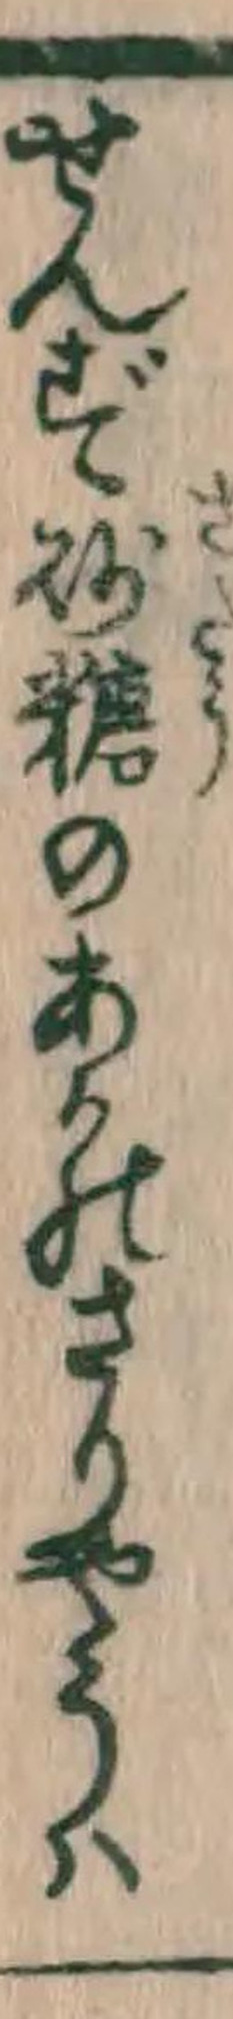せんず砂糖のあかのさりやうは
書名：広益秘事大全 3巻. [5]
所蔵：国立国会図書館 National Diet Library, JAPAN
